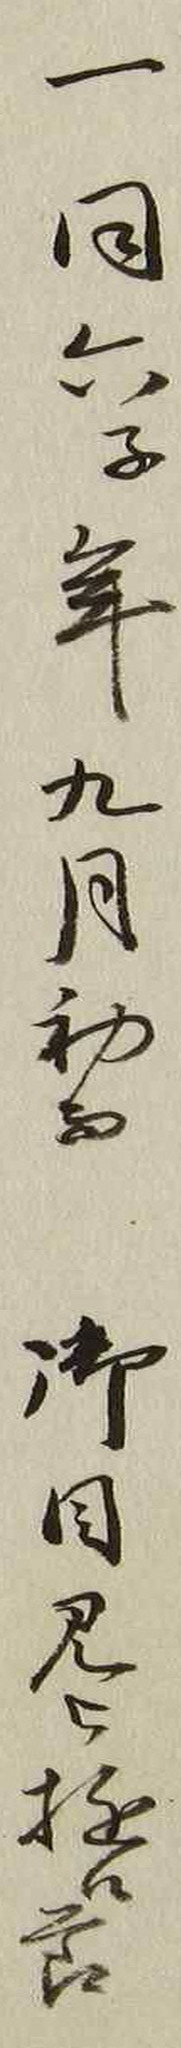一同六子年九月初而御目見被遊候節
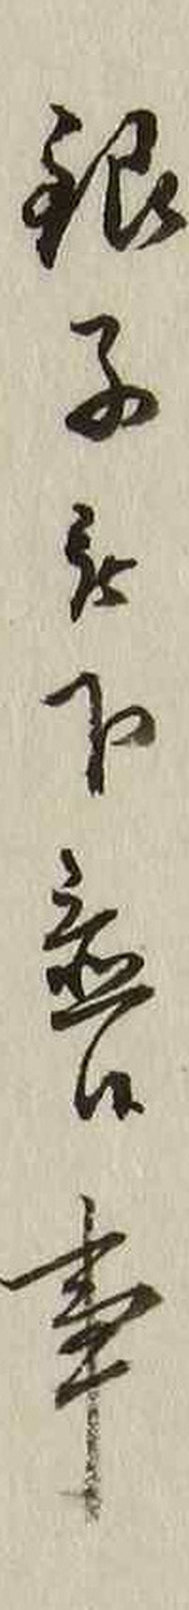銀子被下置候事
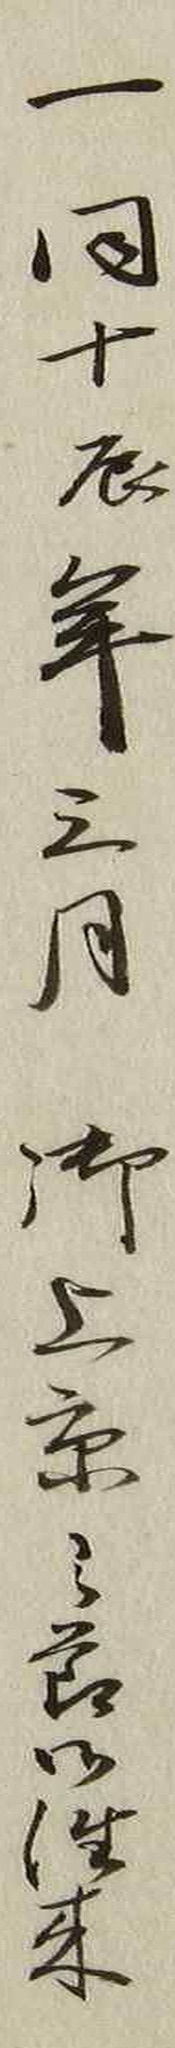一同十辰年三月御上京之節御往来
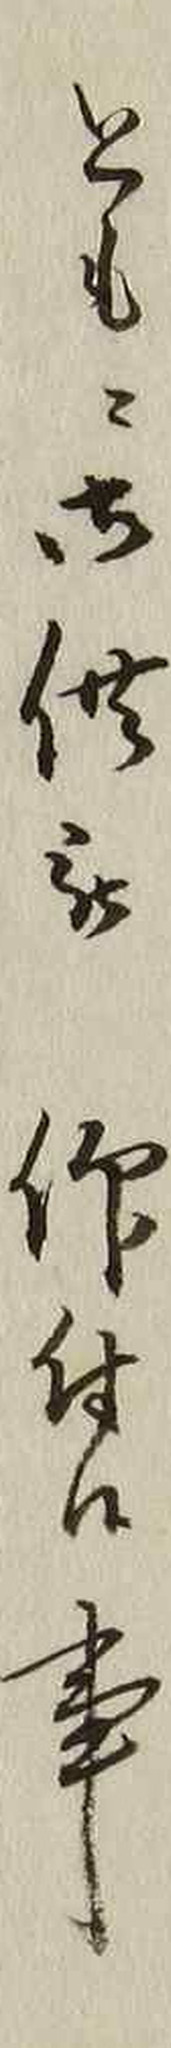ともニ御供被仰付候事
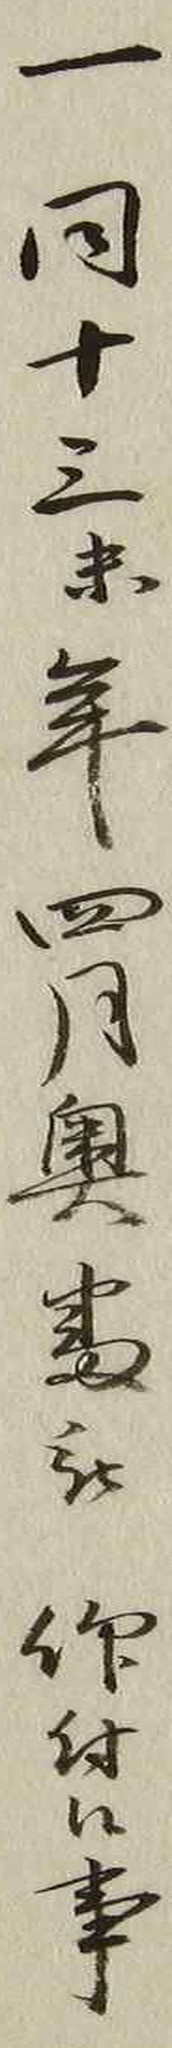一同十三未年四月奥番被仰付候事
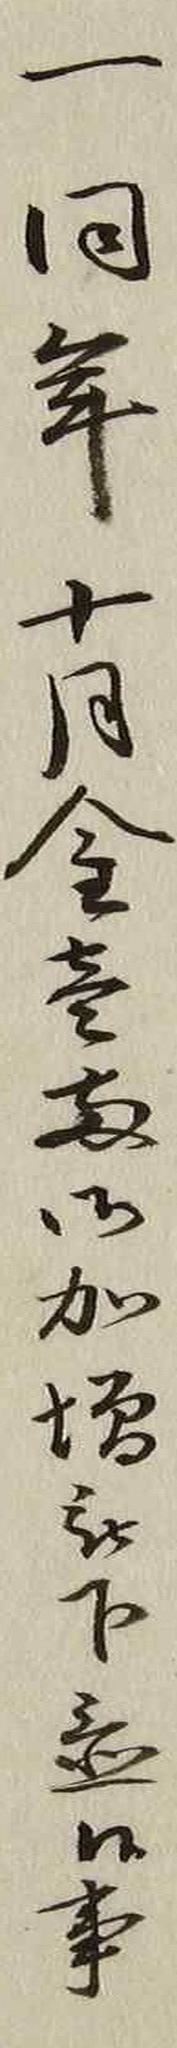一同年十月金壱両御加増被下置候事
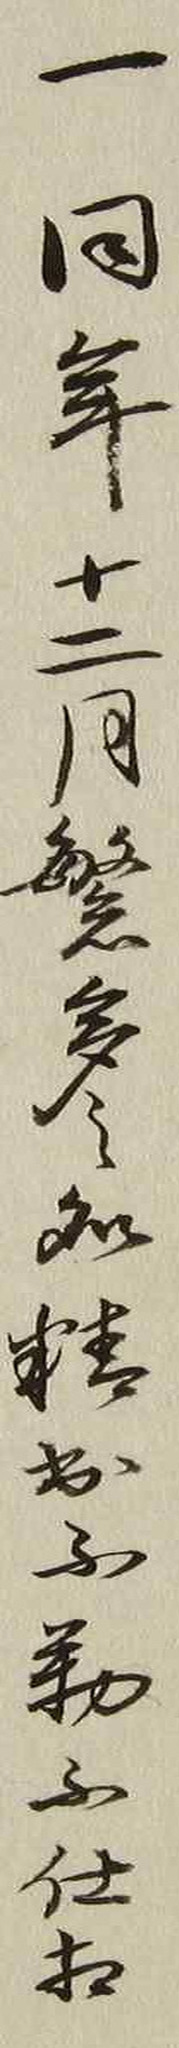一同年十二月繫多之処精出不勤不仕相
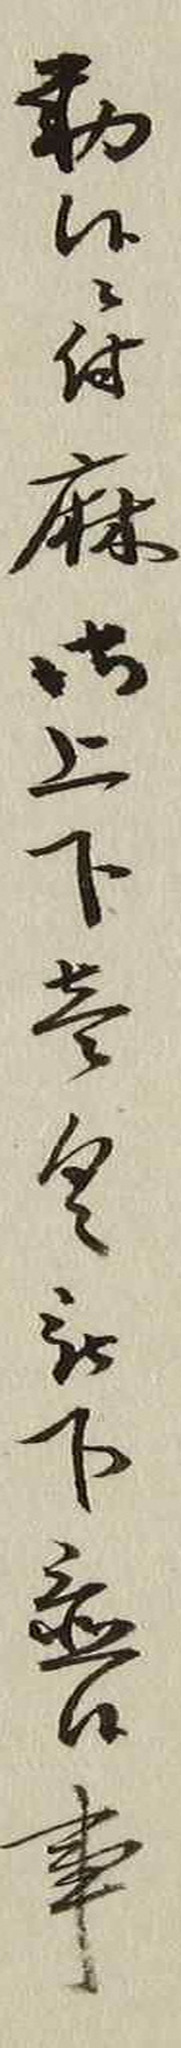勤候ニ付麻御上下壱具被下置候事
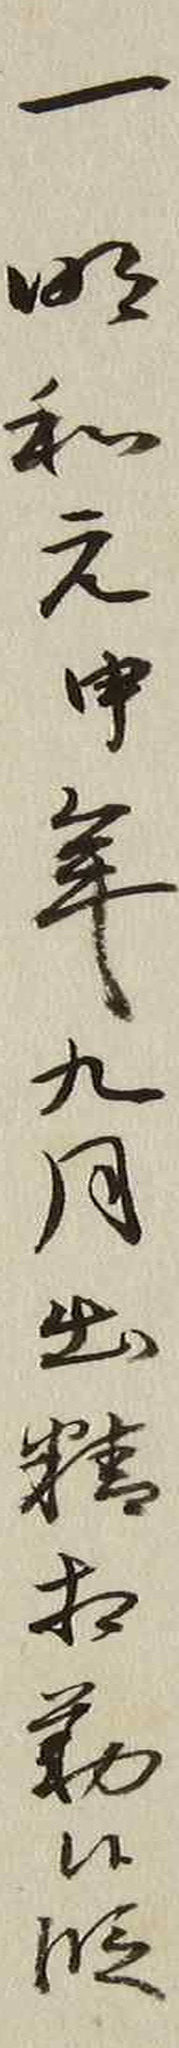一明和元申年九月出精相勤候段
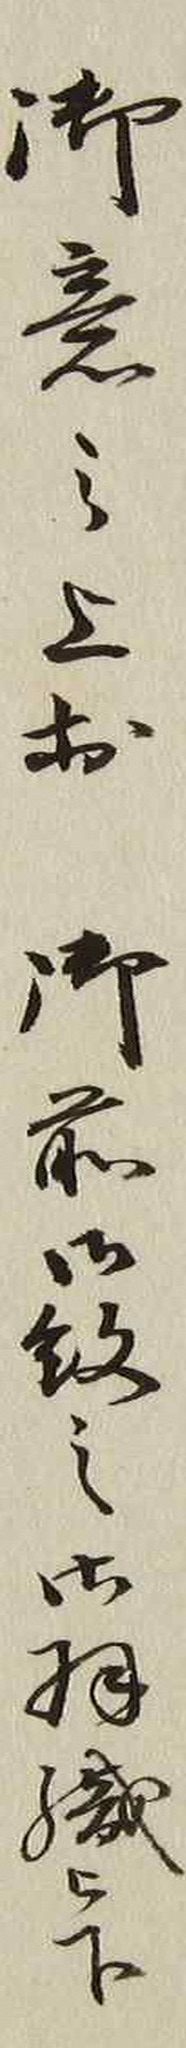御意之上於御前御紋之御羽織被下
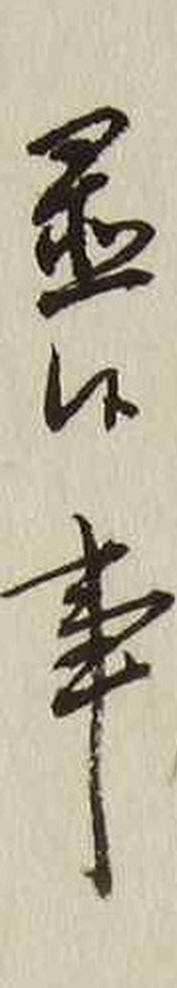置候事
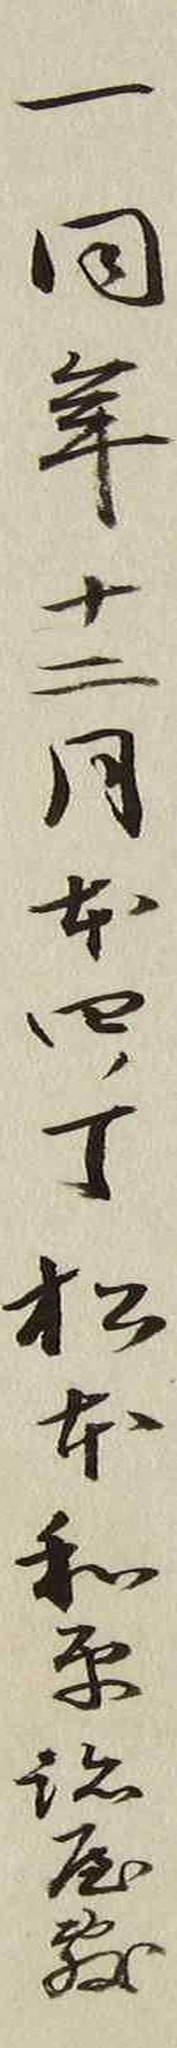一同年十二月本四ノ丁松本和原跡屋敷
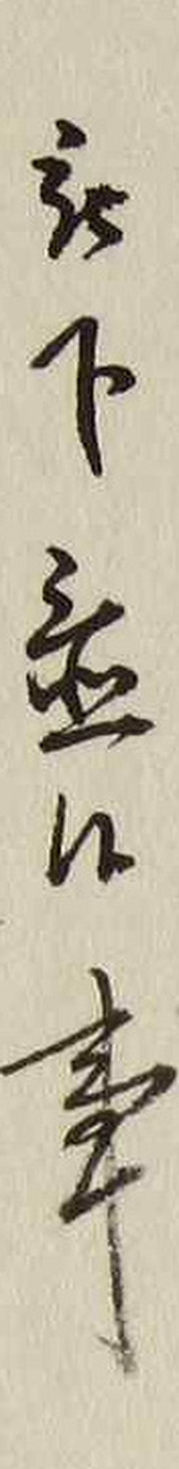被下置候事
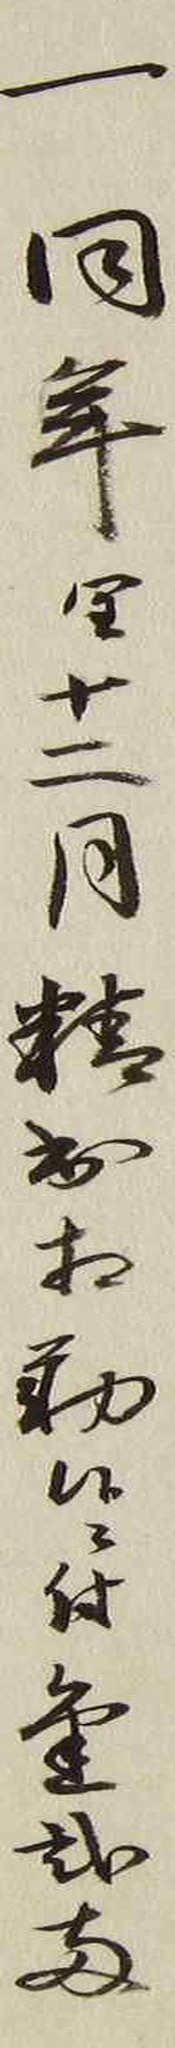一同年閏十二月精出相勤候ニ付金弐両
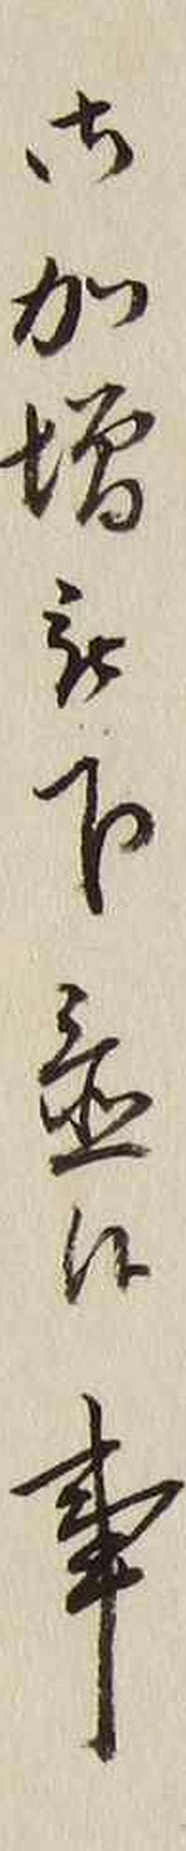御加増被下置候事
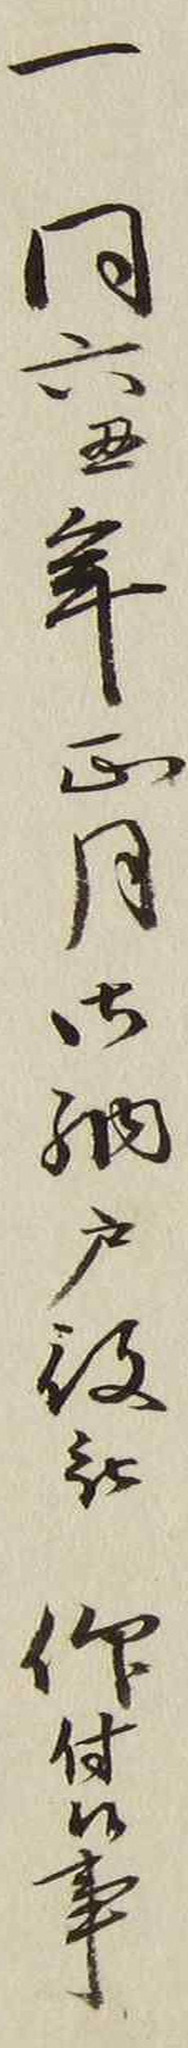一同六丑年正月御納戸役被仰付候事
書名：諸士系譜　巻之160　な之部2
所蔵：会津若松市立会津図書館
